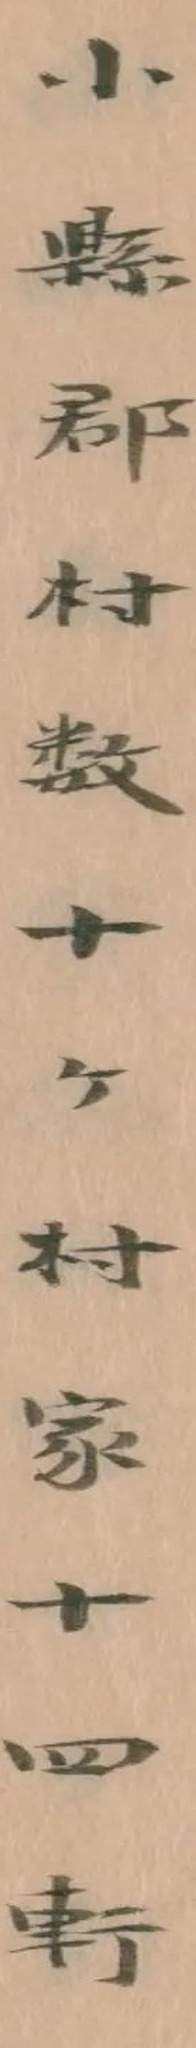小県郡村数十ヶ村家十四軒
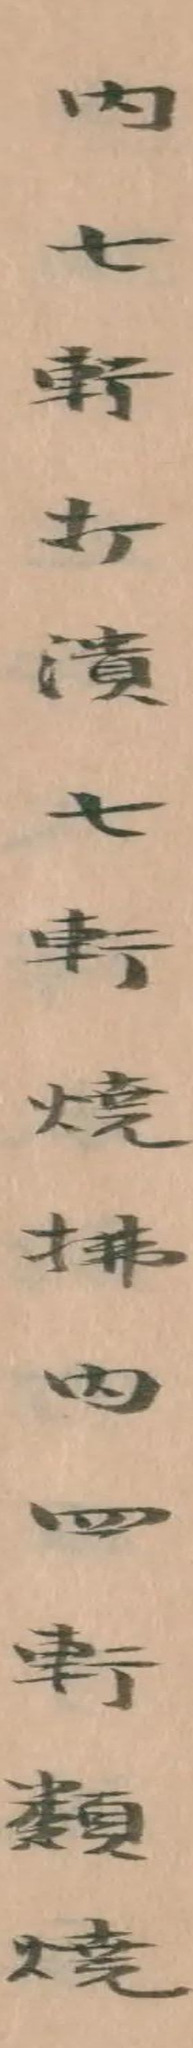内七軒打潰七軒焼払内四軒類焼
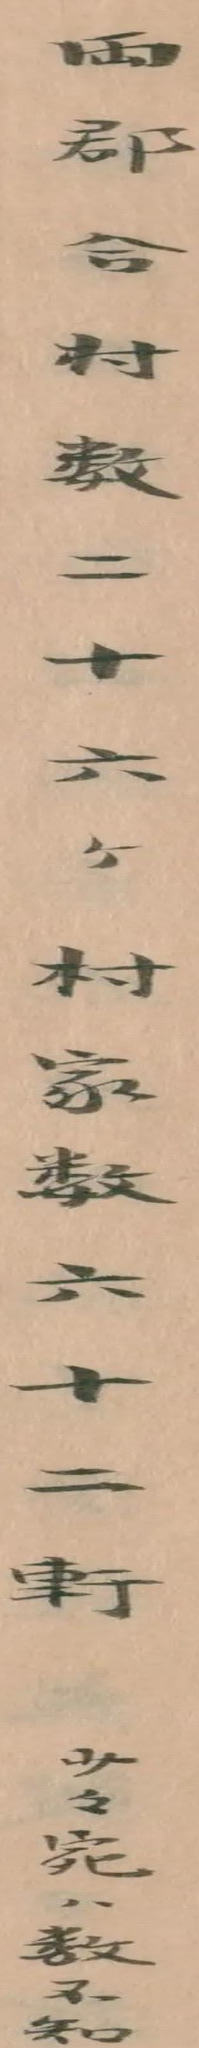両郡合村数二十六ヶ村家数六十二軒少々宛ハ数不知
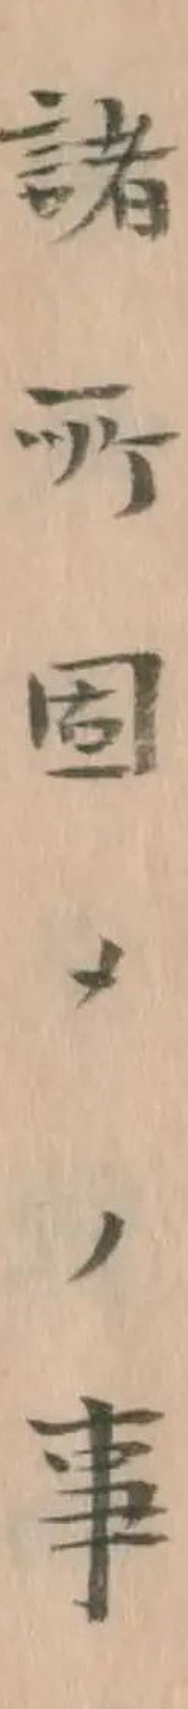諸所固メノ事
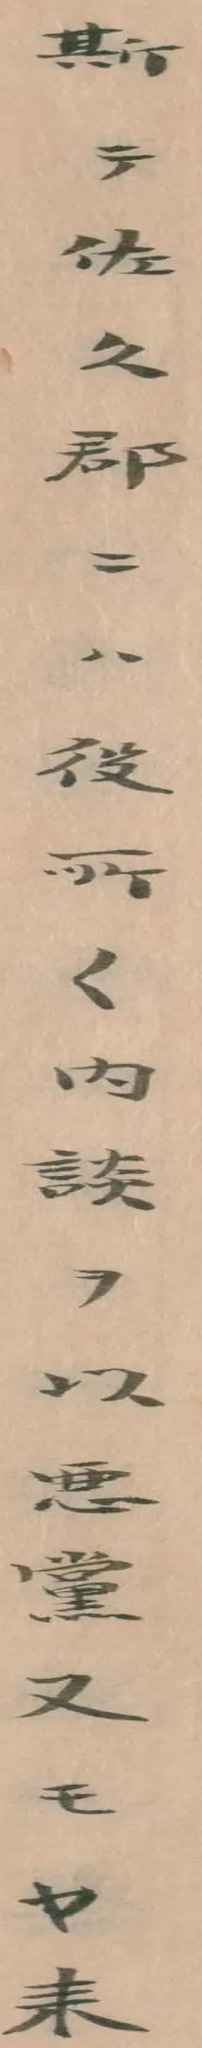斯テ佐久郡二ハ彼行所〳〵内談ヲ以悪党又モヤ来
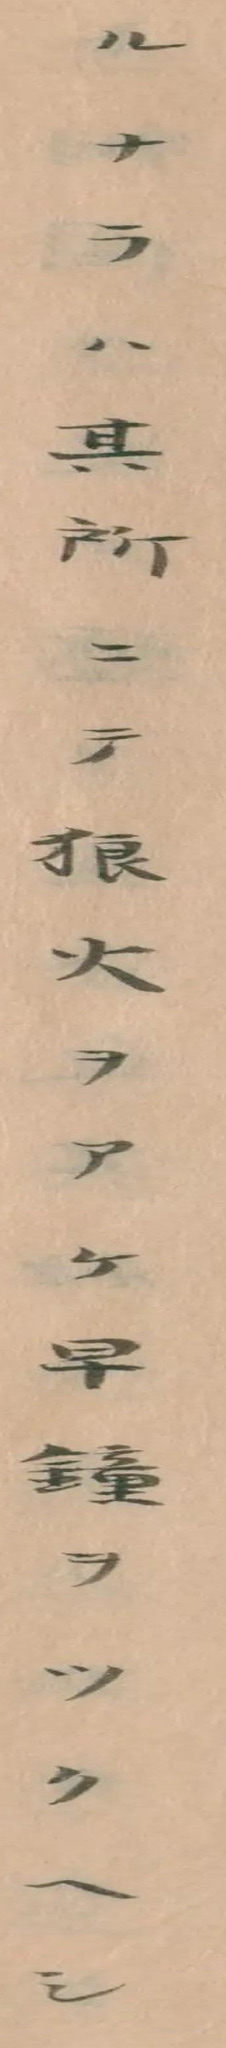ルナランハ其所二テ狼火ヲアケ早鐘ヲツクヘシ

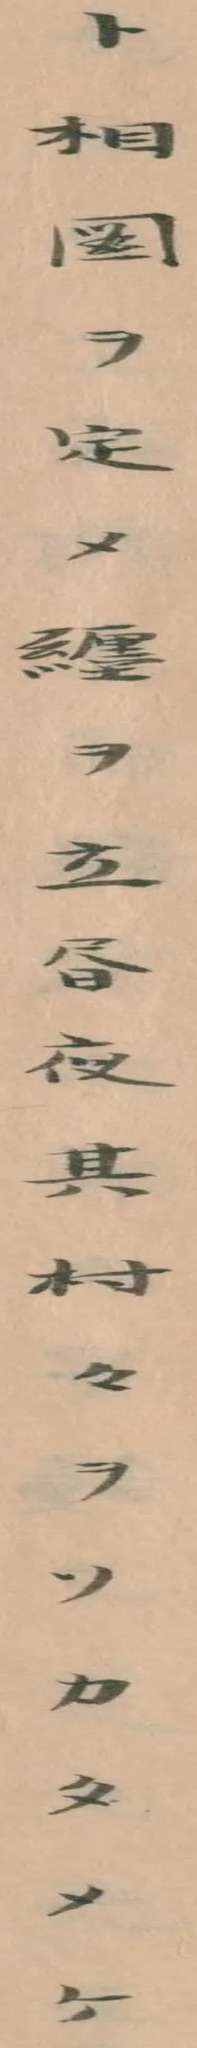ト相図ヲ定メ纏ヲ立昼夜其村々ヲソカタメケ
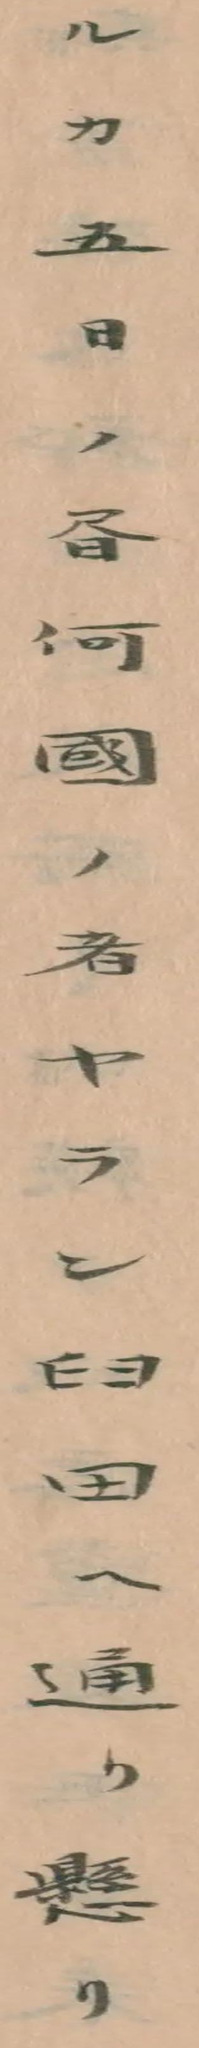ルカ五日ノ昼何国ノ者ヤラン臼田へ通り懸り
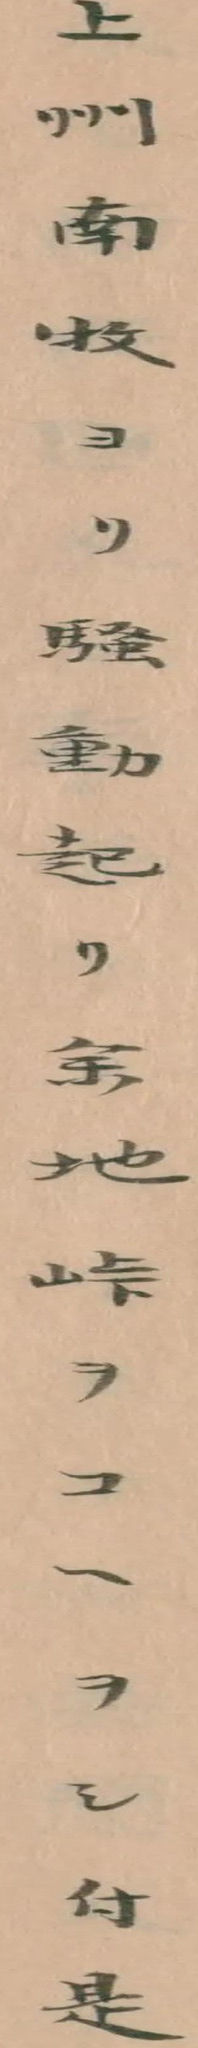上州南牧ヨリ騒動起り余地峠ヲコへヲシ付是
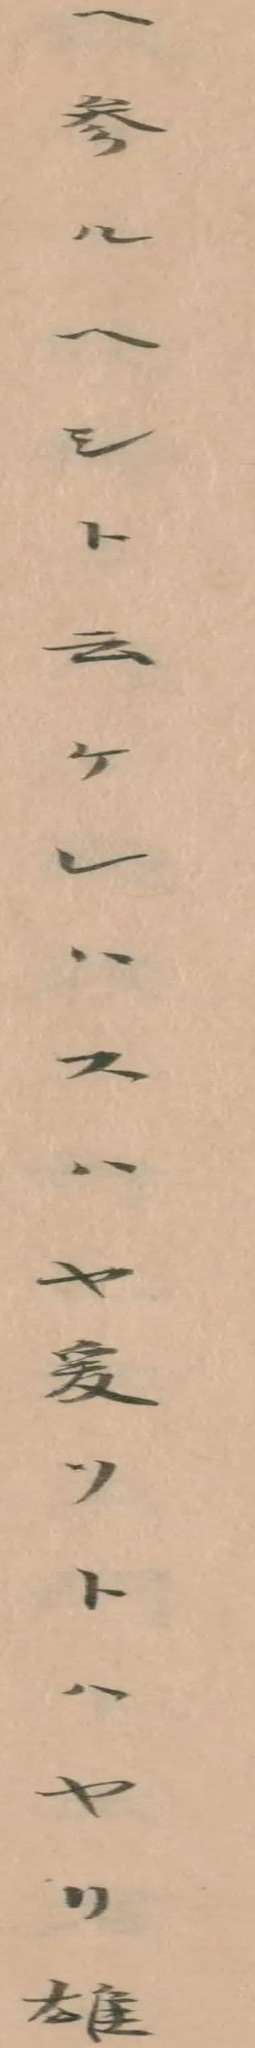へ参ルヘシト云ケレハスハヤ爰ソトハヤク雄
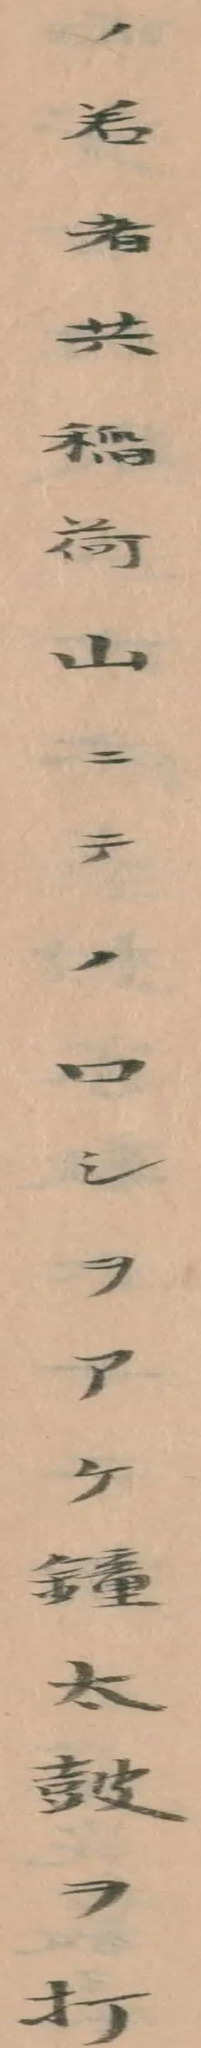ノ若者共稲荷山二テノロシヲアケ鐘太鼓ヲ打
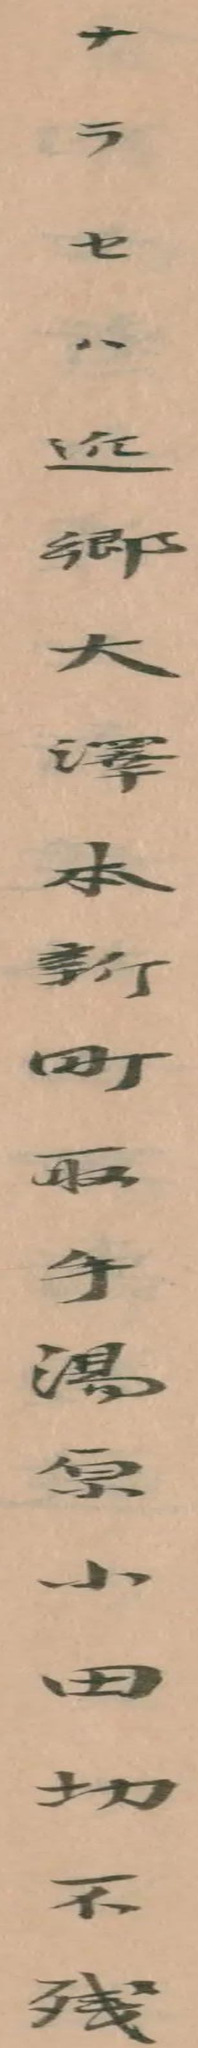ナラセハ近郷大沢本所町取手湯原小田切不残
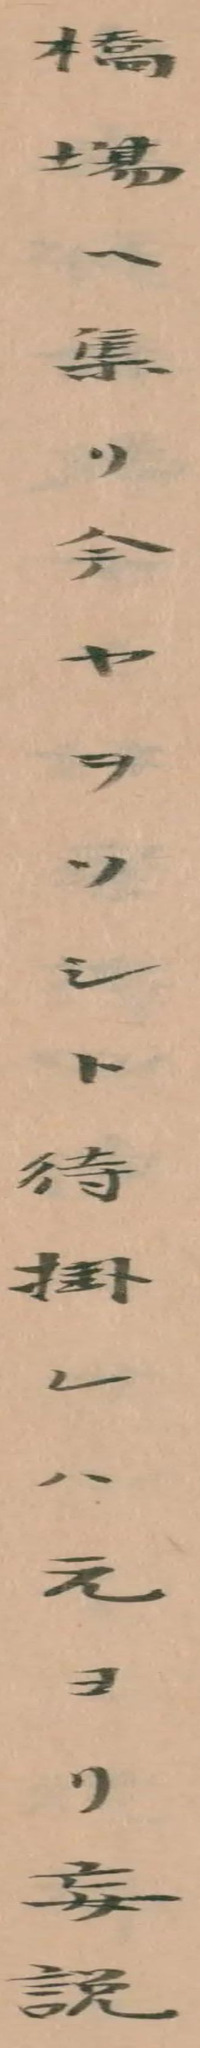橋場へ集り今ヤヲソシト待掛レハ元ヨリ妄説
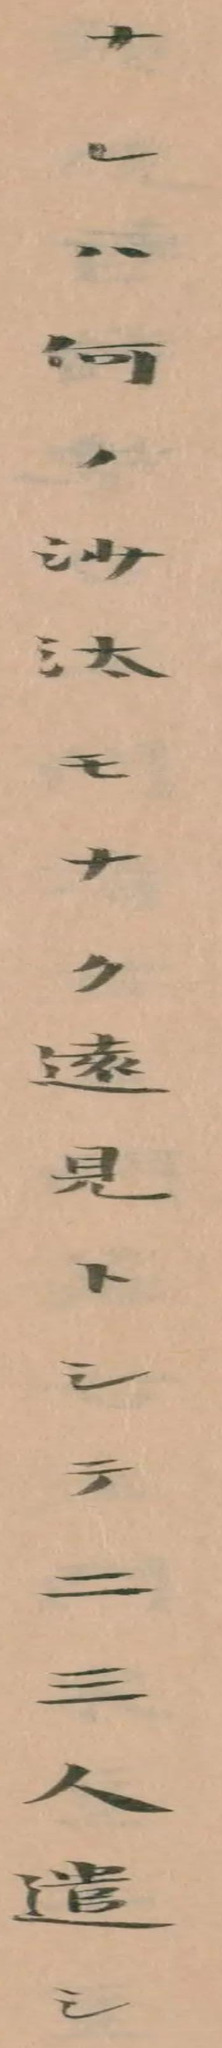ナレハ何ノ沙汰モナク遠見トシテ二三人遣シ
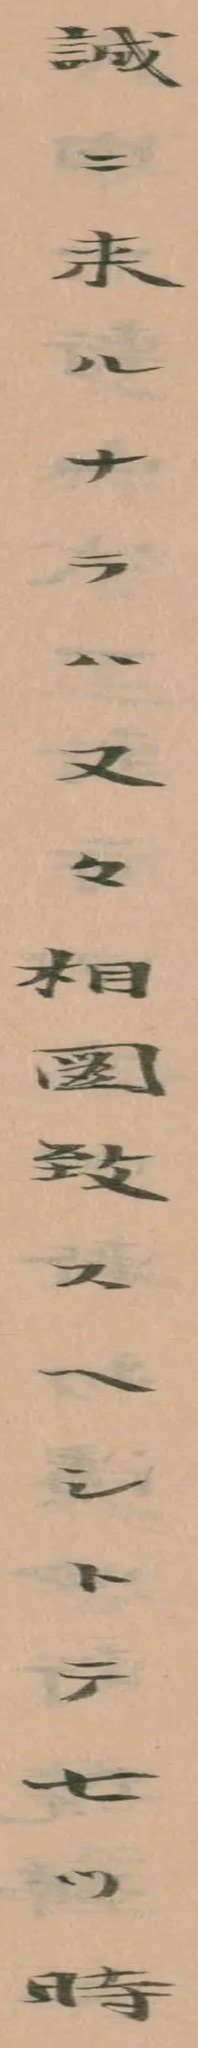誠二来ルナラハ又々相図致スヘシトテ七ッ時
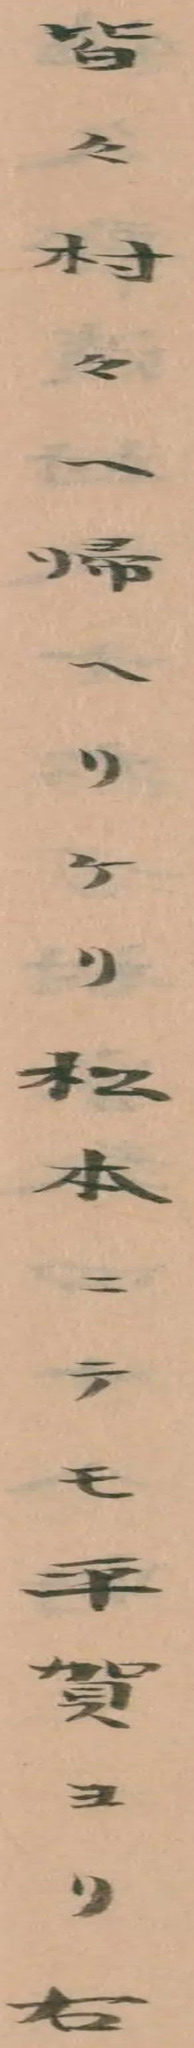皆々村々へ帰へりケリ松本二テモ平賀ヨリ右
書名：地災撮要. 巻3(地震之部)-巻4(噴火之部)
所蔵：国立国会図書館 National Diet Library, JAPAN
